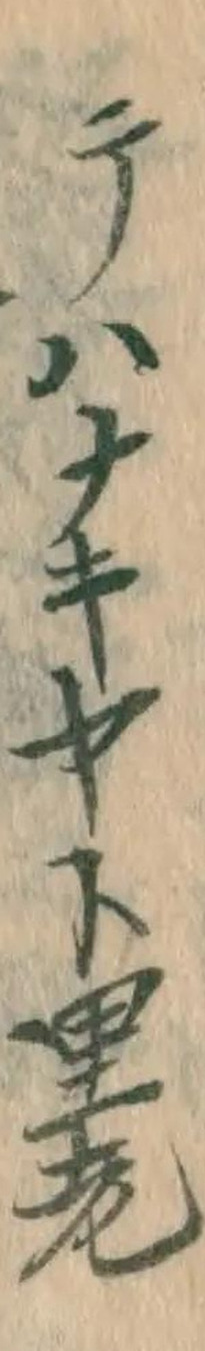テハナキヤト里老
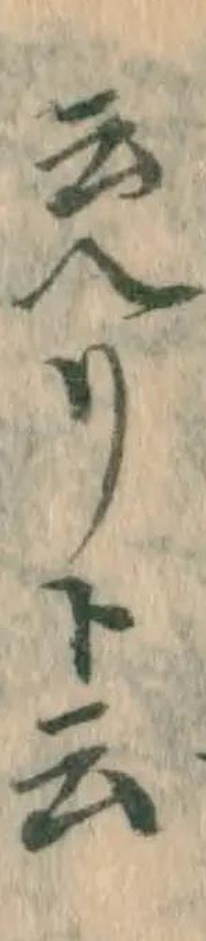云ヘリト云

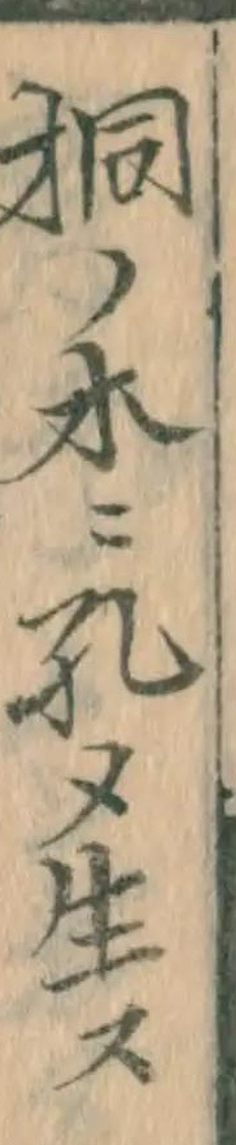桐ノ木ニ孔シテ生ス
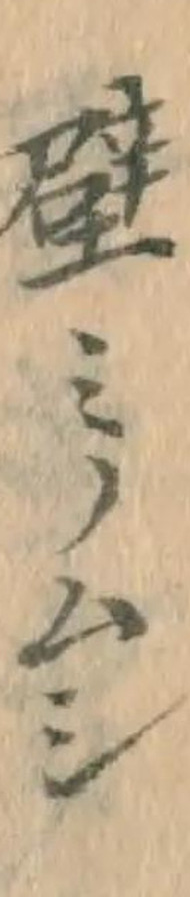壁ミノムシ
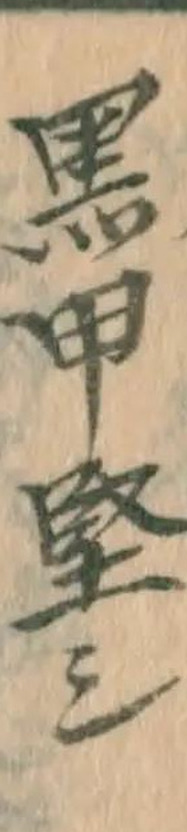黒甲堅シ
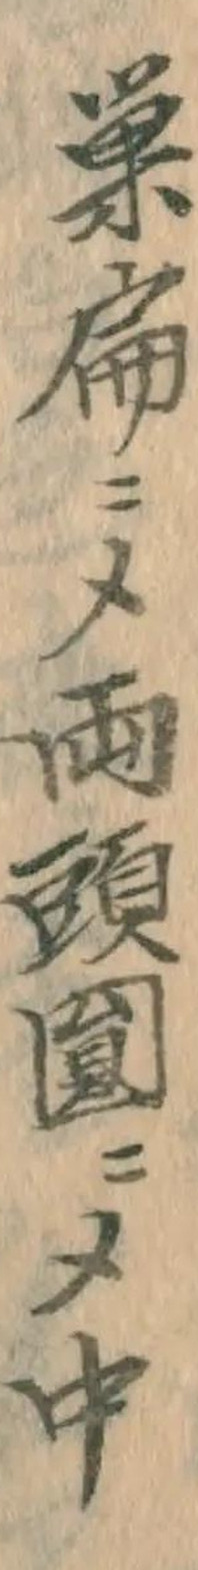巣扁ニシテ両頭圓ニシテ中
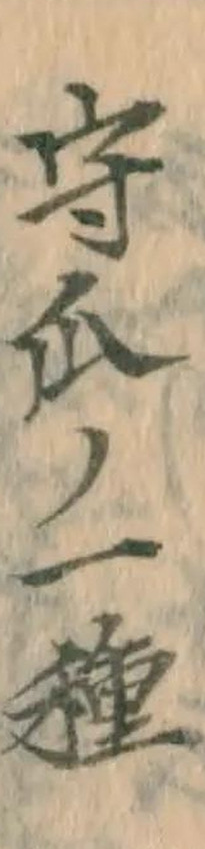守瓜ノ一種
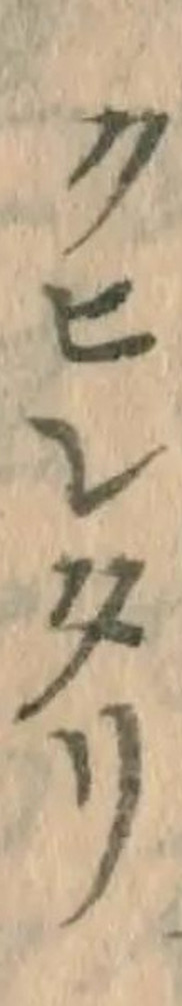クヒレタリ
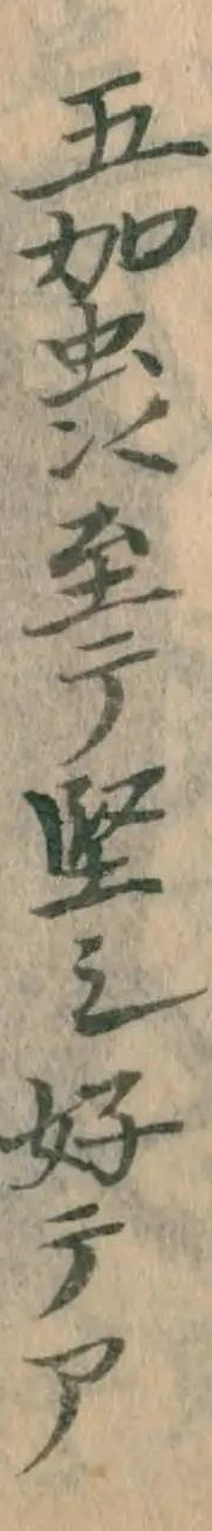五加蟲至テ堅シ好テア
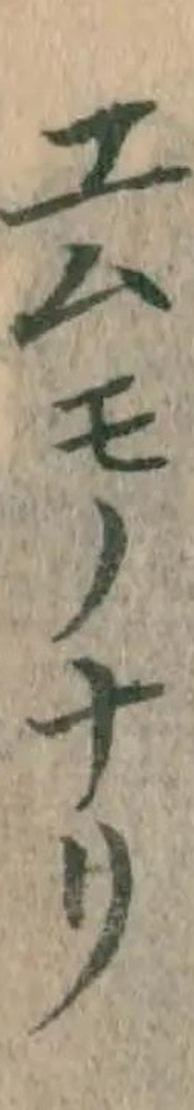エムモノナリ
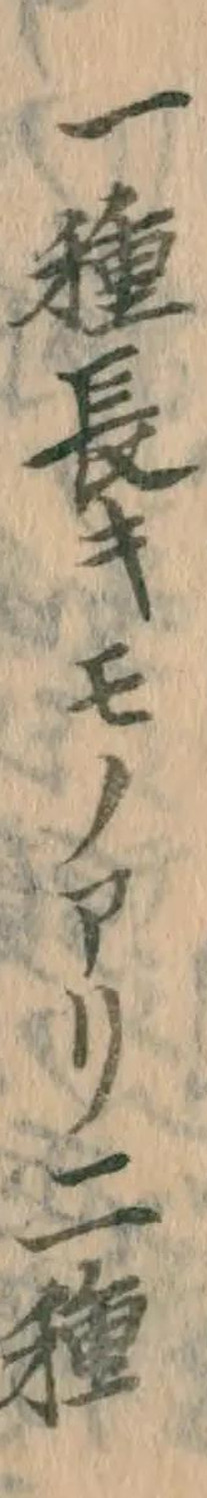一種長キモノアリ二種
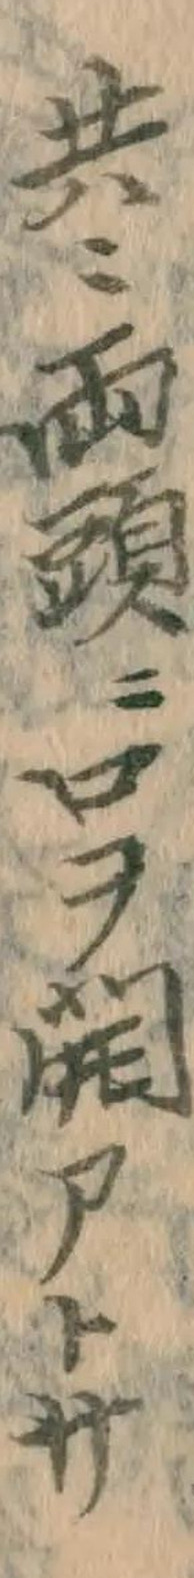共ニ両頭ニ口ヲ開アトサ
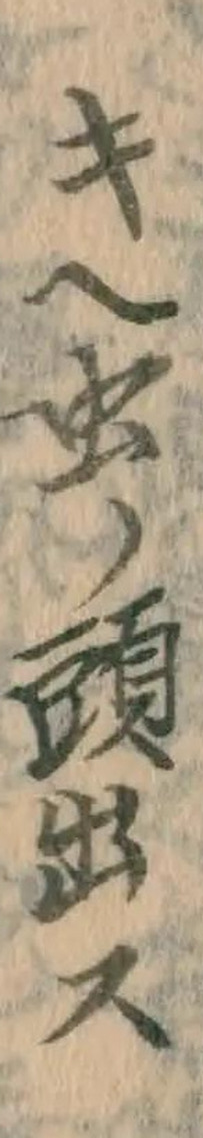キヘ虫ノ頭出ス
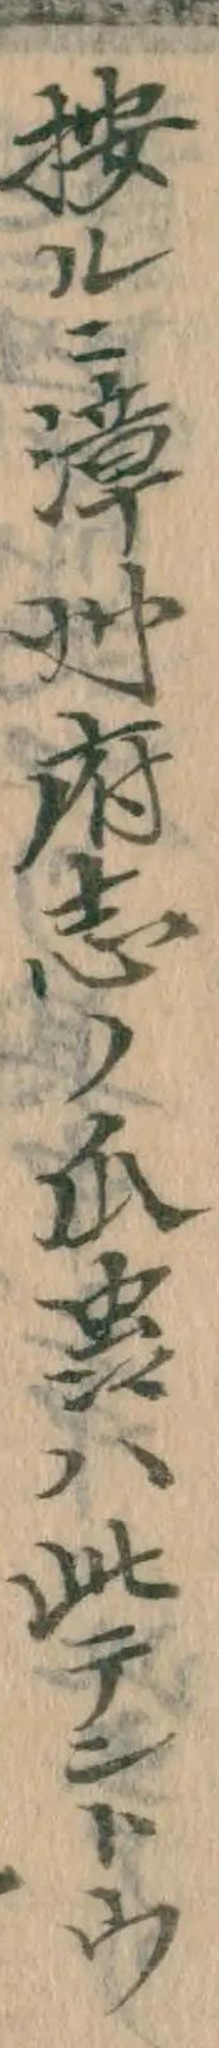按ルニ漳州府志ノ瓜蟲ハ此テントウ
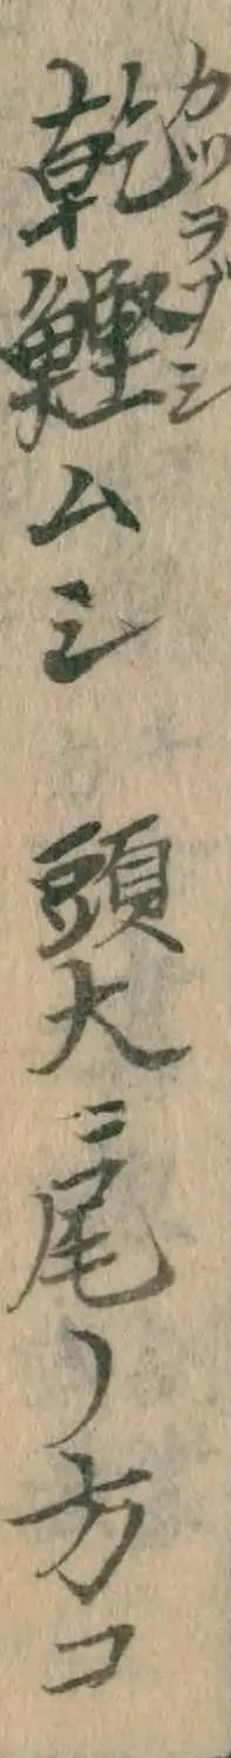乾鰹ムシ頭大ニ尾ノ方コ
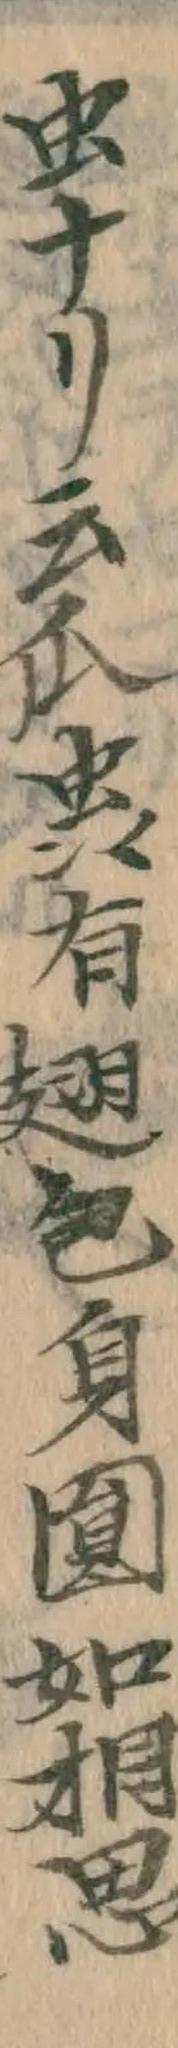虫ナリ云瓜蟲有翅包身圓如相思
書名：千蟲譜 3巻. [2]
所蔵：国立国会図書館 National Diet Library, JAPAN
